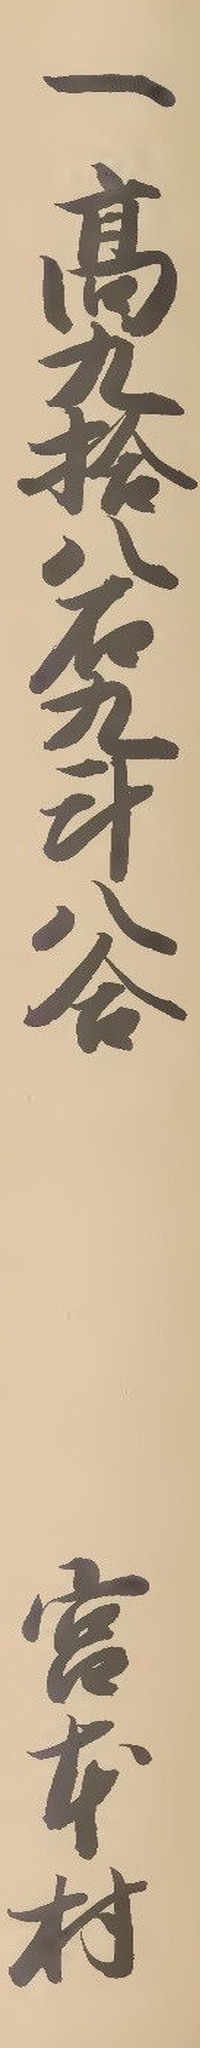一高九拾八石九斗八合宮本村
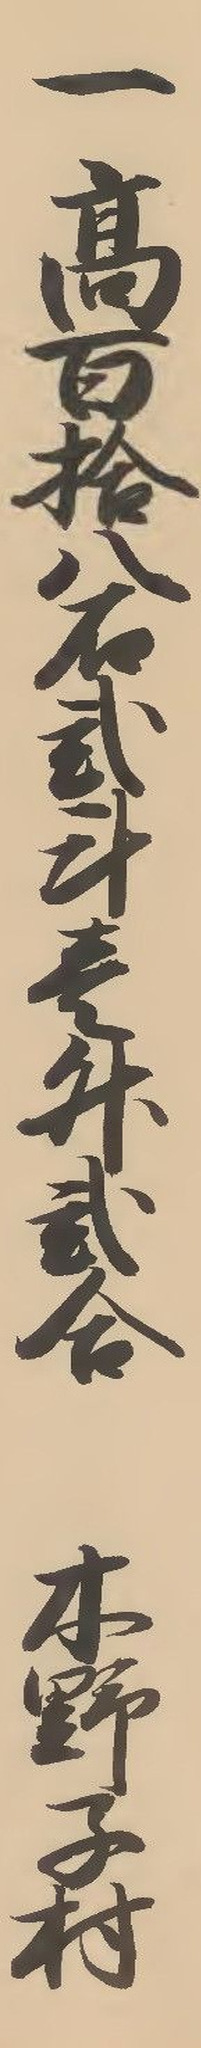一高百拾八石弐斗壱升弐合木野子村
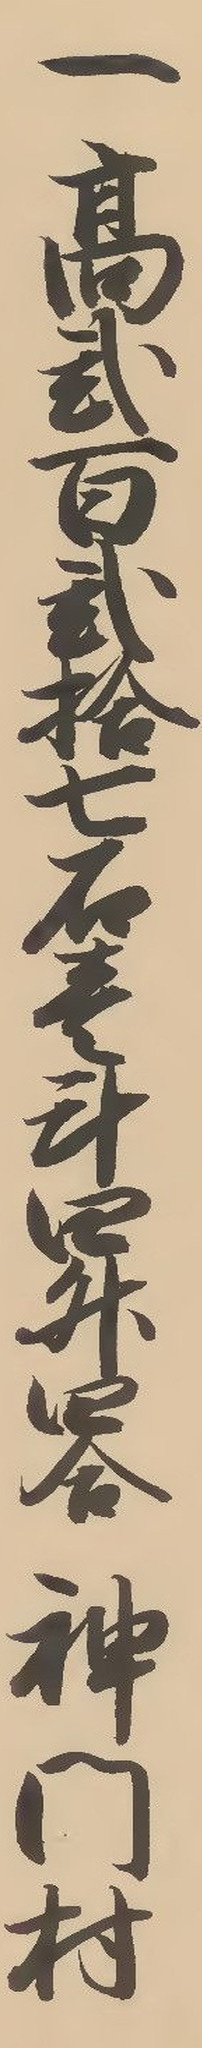一高弐百弐拾七石壱斗四升四合神門村
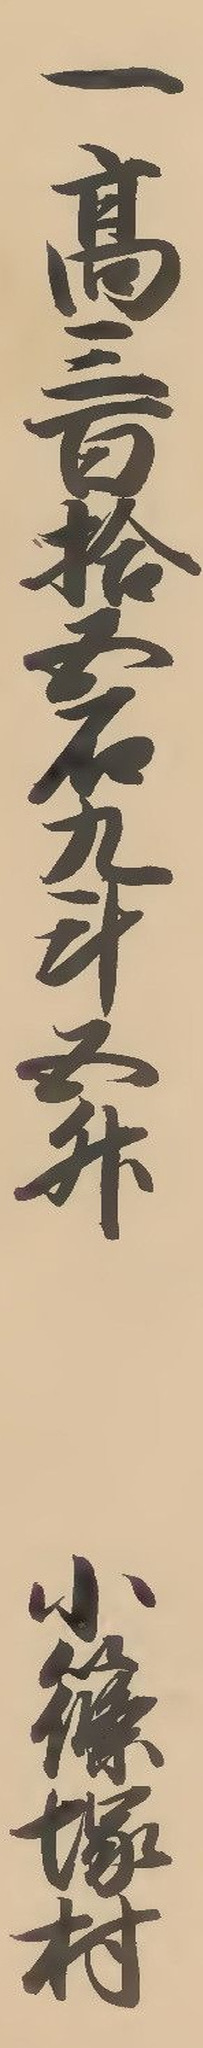一高三百拾五石九斗五升小篠塚村

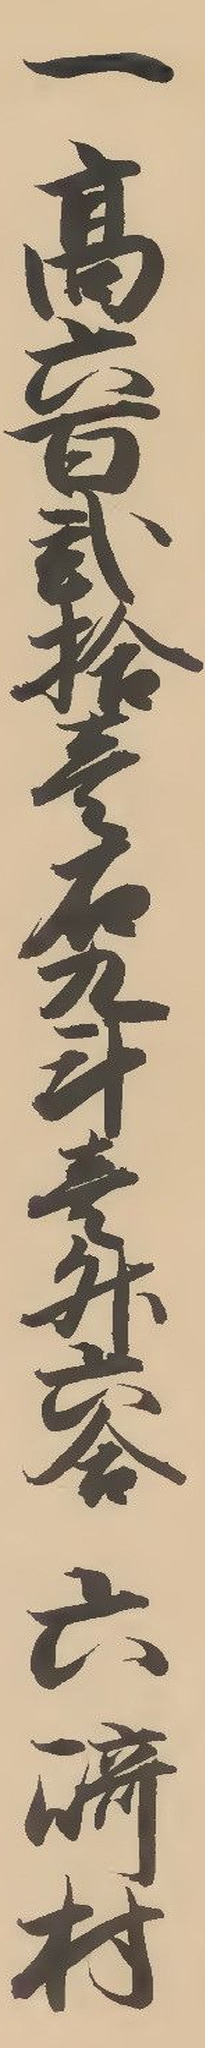一高六百弐拾壱石九斗壱升六合六崎村
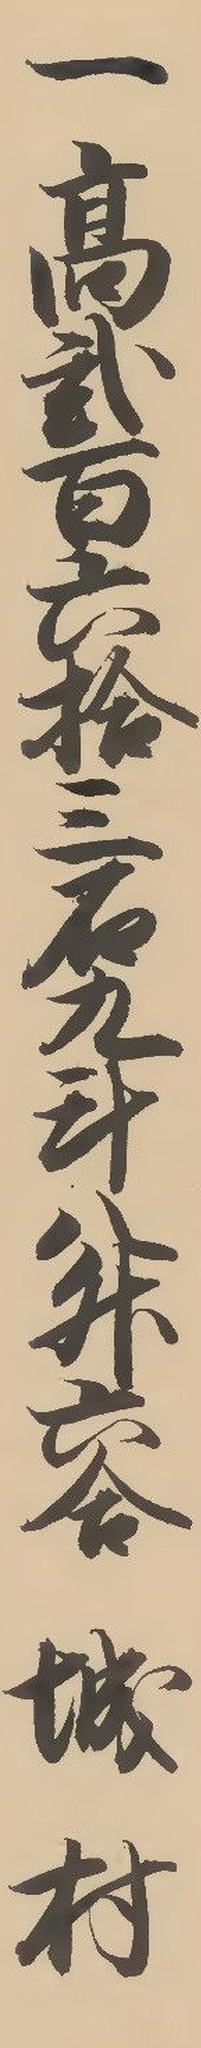一高弐百六拾三石九斗八升六合城村
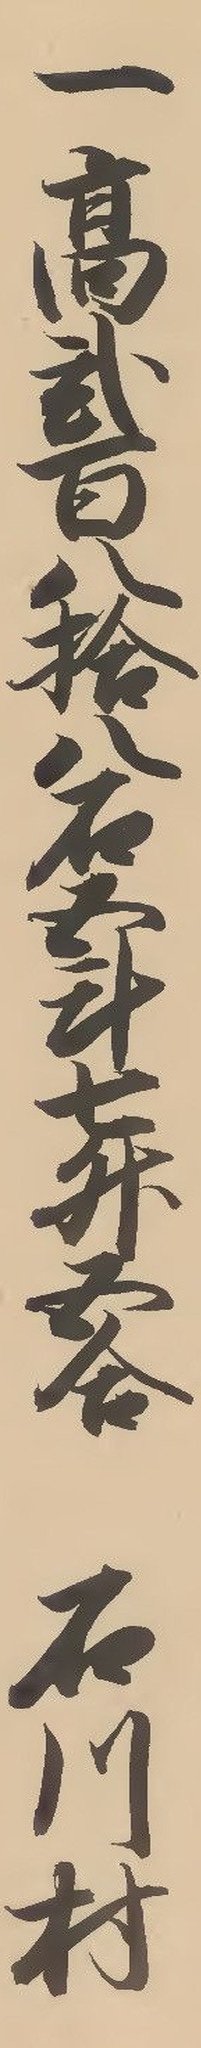一高弐百八拾八石五斗七升五合石川村
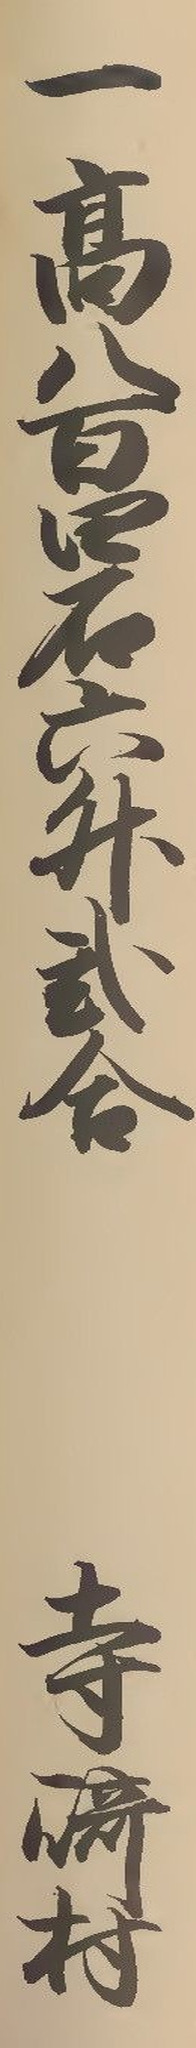一高八百四石六升弐合寺崎村
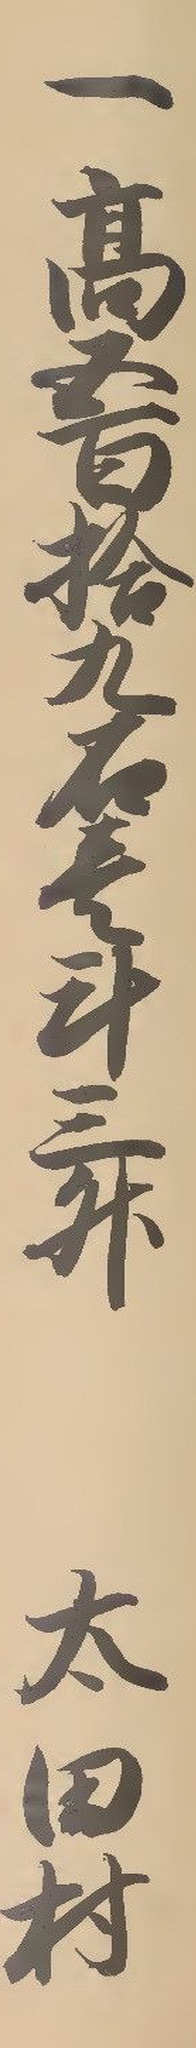一高五百拾九石壱斗三升太田村
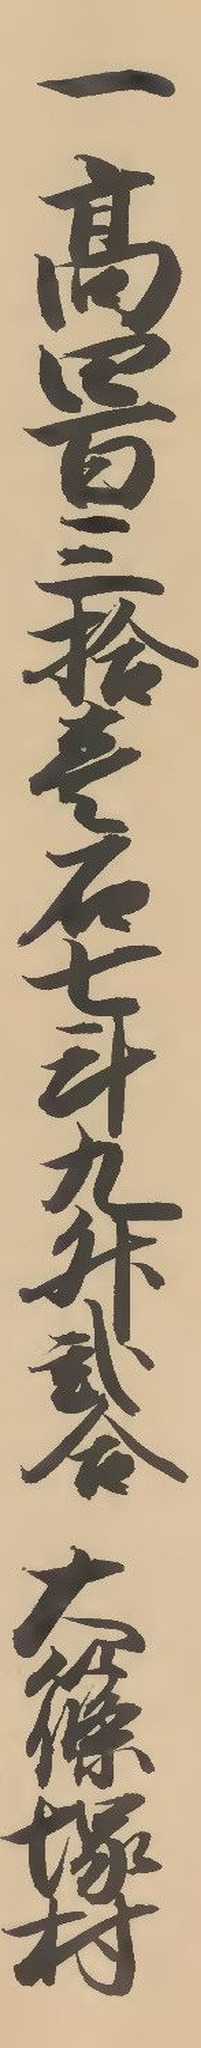一高四百三拾壱石七斗九升弐合大篠塚村
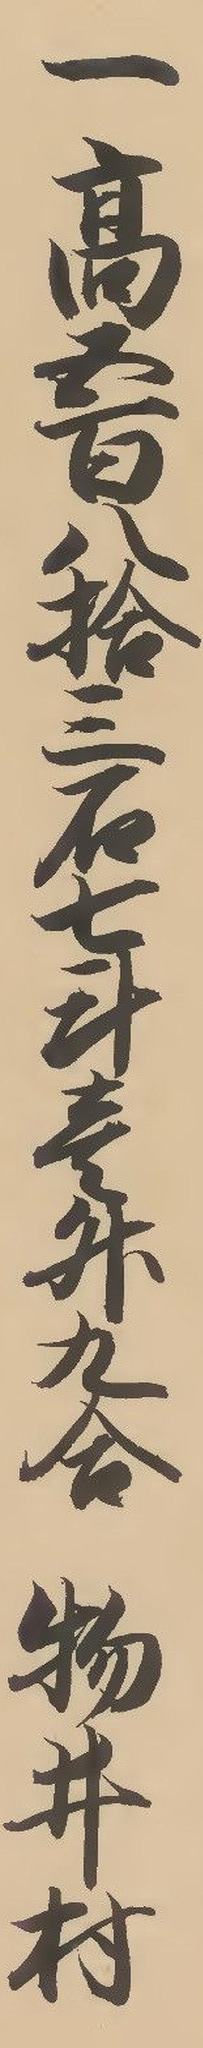一高五百八拾三石七斗壱升九合物井村
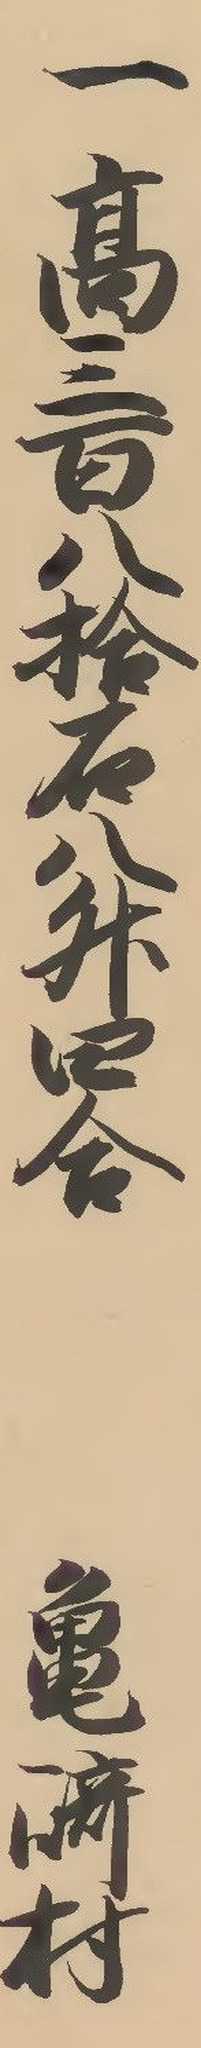一高三百八拾石八升四合亀崎村

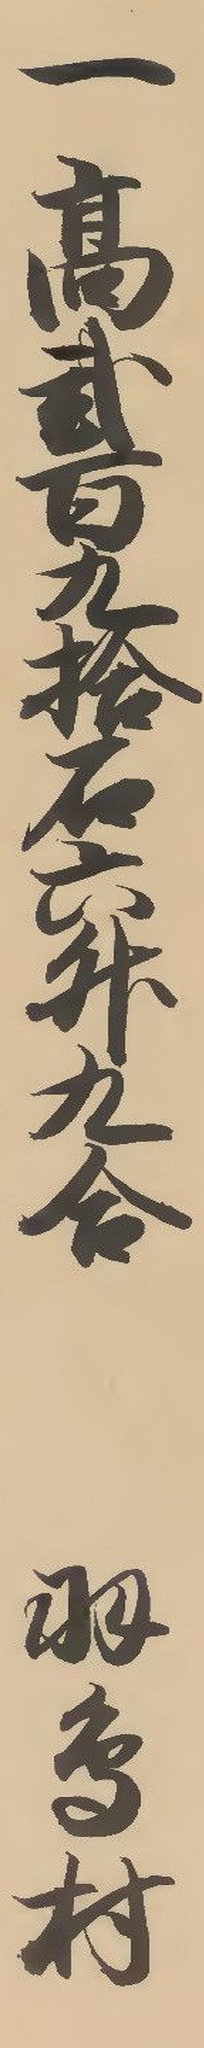一高弐百九拾石六升九合羽鳥村
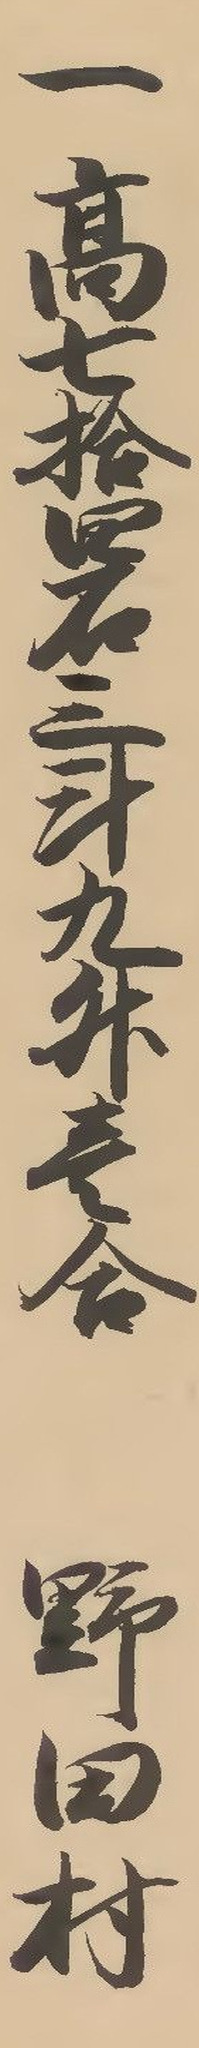一高七拾四石三斗九升壱合野田村
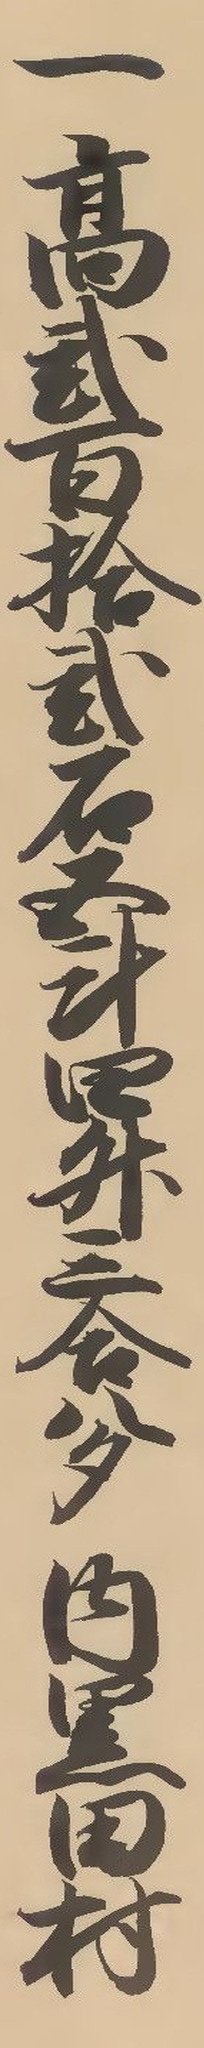一高弐百拾弐石五斗四升三合八勺内黒田村
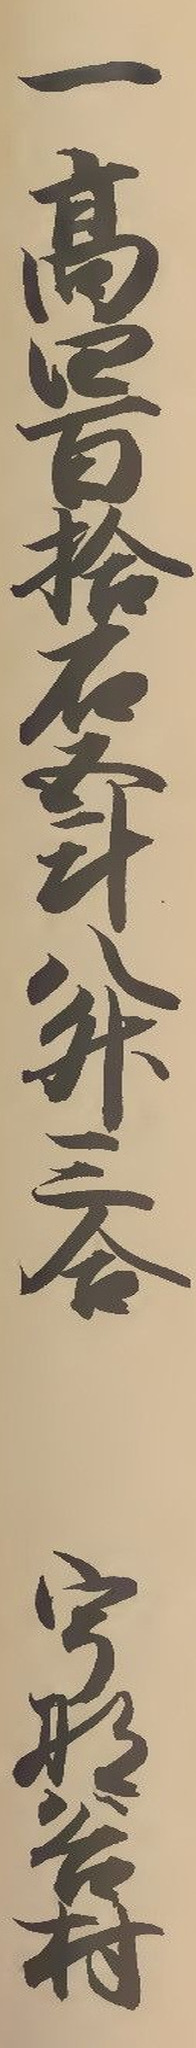一高四百拾石五斗八升三合宇那谷村
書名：下総国郷帳
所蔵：国立公文書館 National Archives of Japan
